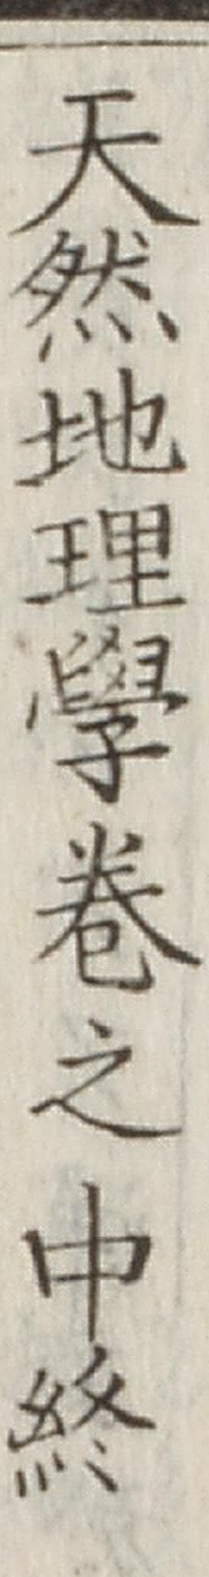天然地理学巻之中終
